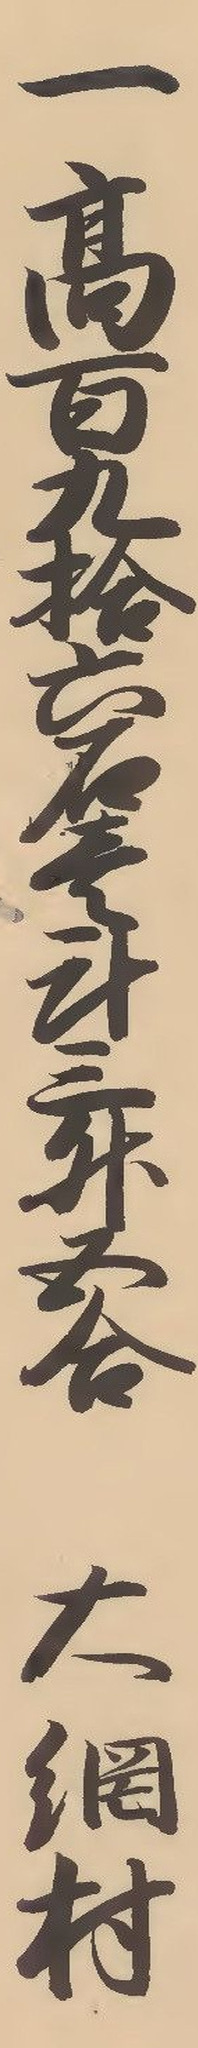一高百九拾六石壱斗三升五合大網村
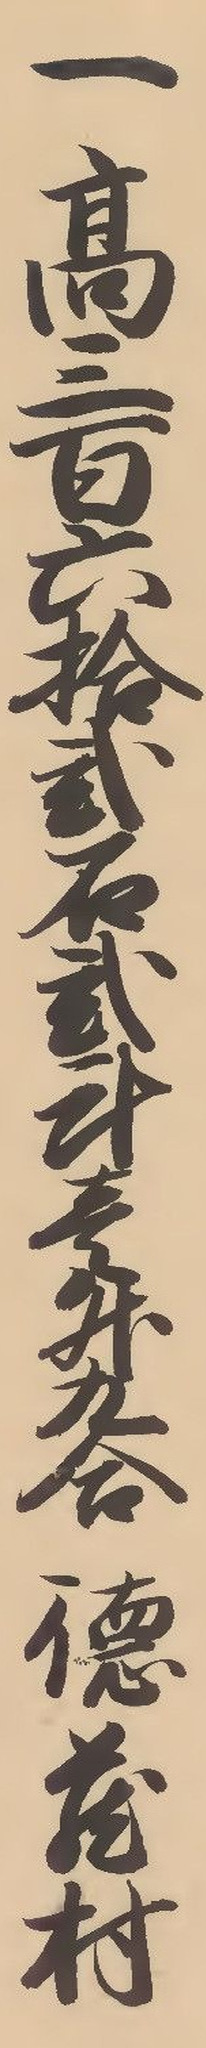一高三百六拾弐石弐斗壱升九合徳蔵村
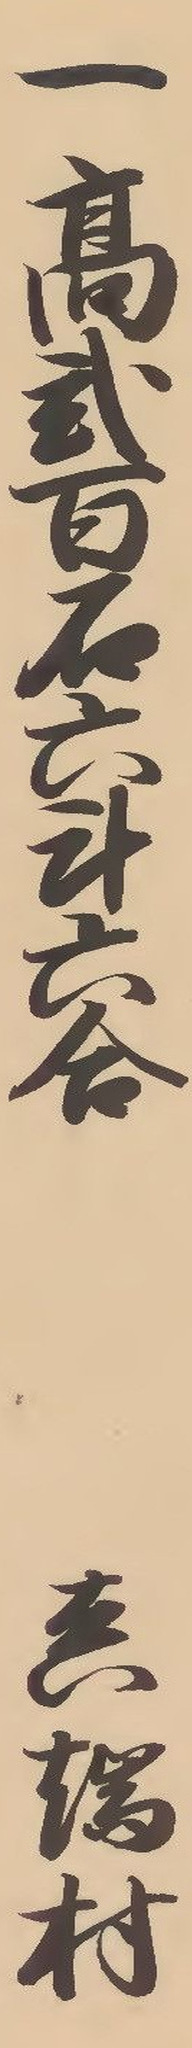一高弐百石六斗六合真端村
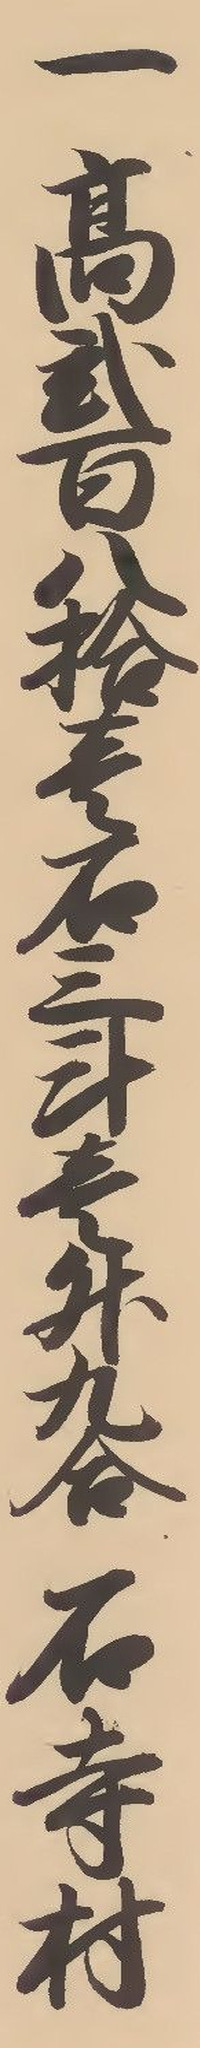一高弐百八拾壱石三斗壱升九合石寺村
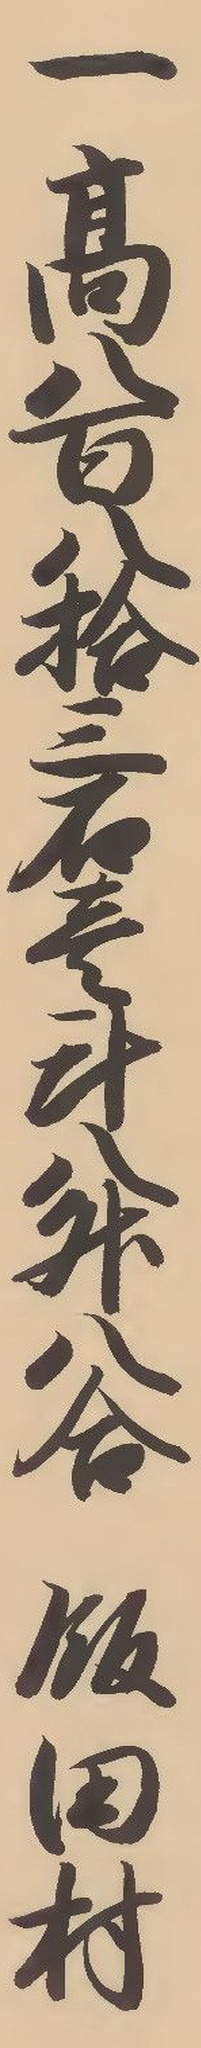一高八百八拾三石壱斗八升八合飯田村
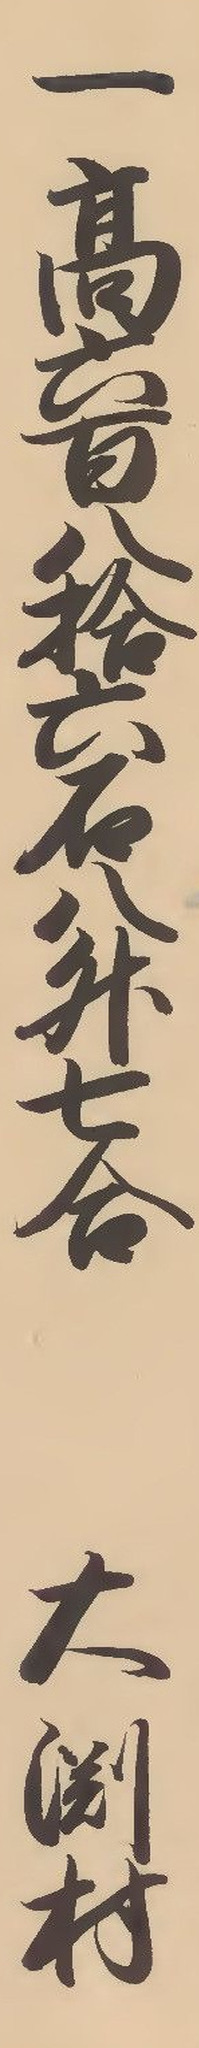一高六百八拾六石八升七合大淵村
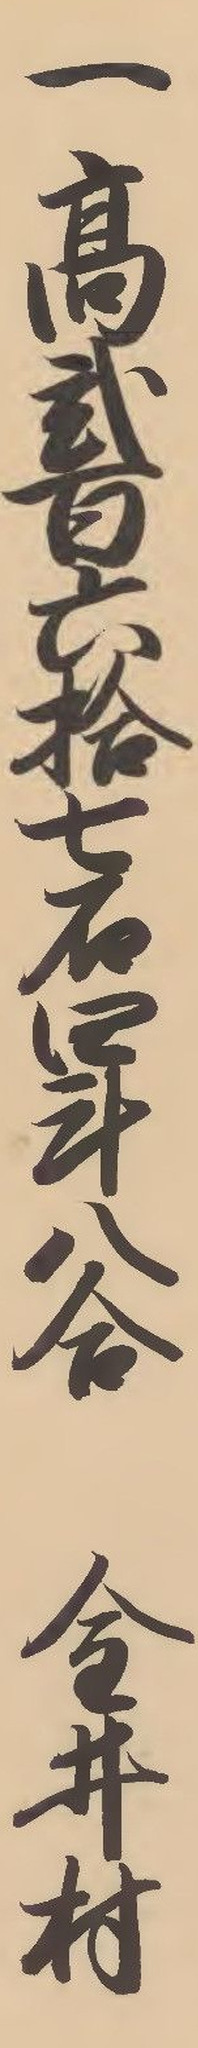一高弐百六拾七石四斗八合金井村

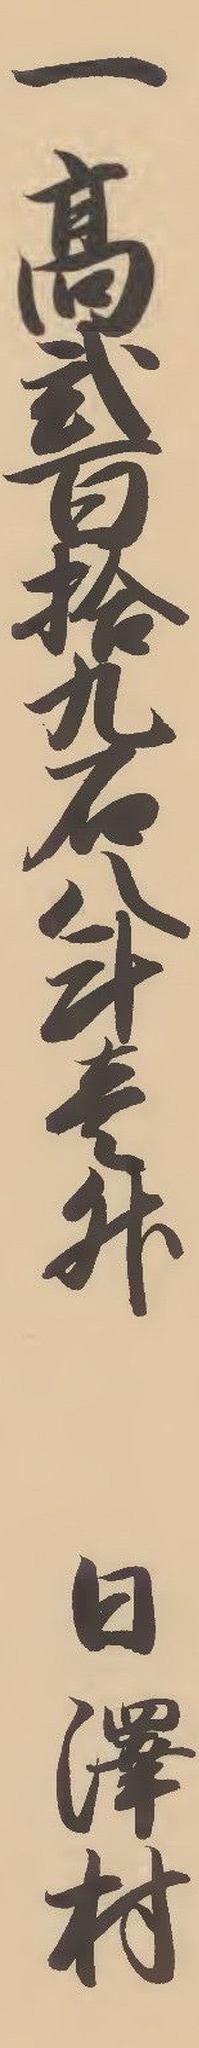一高弐百拾九石八斗壱升日沢村
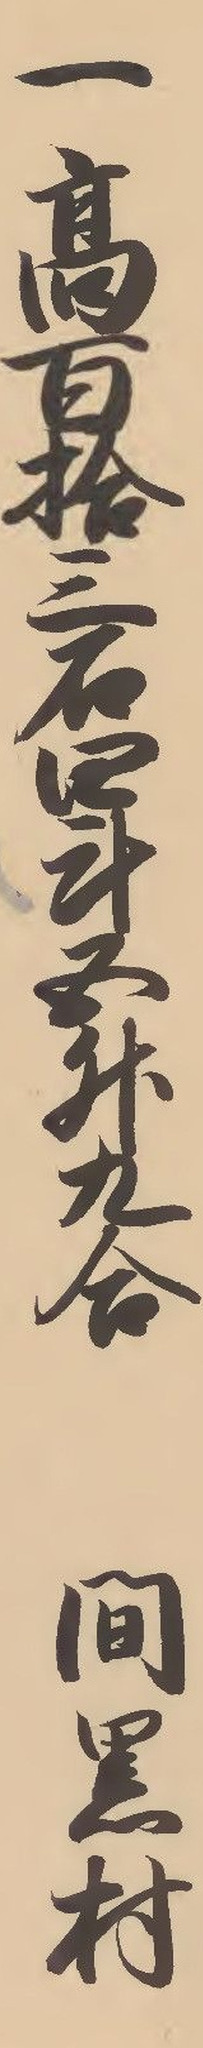一高百拾三石四斗五升九合間黒村
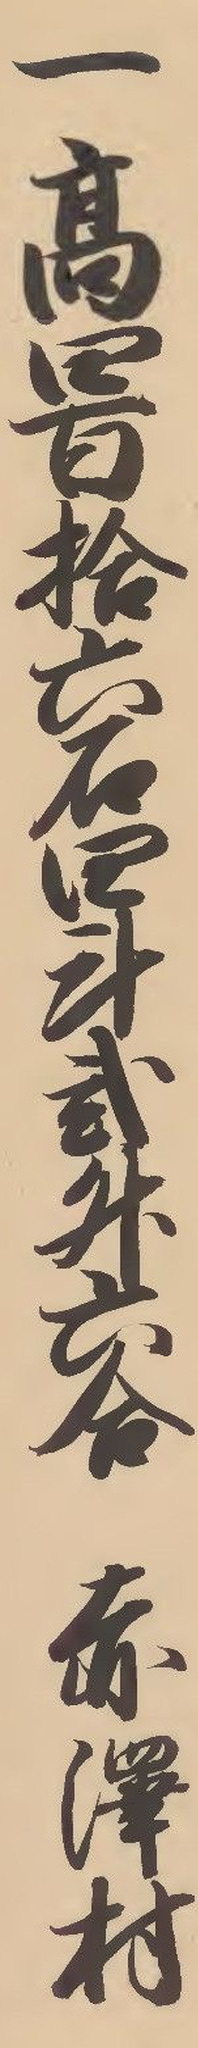一高四百拾六石四斗弐升六合赤沢村
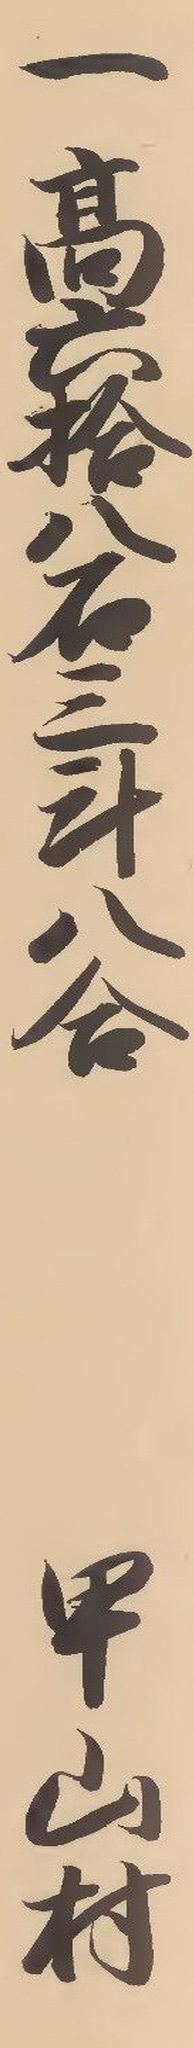一高六拾八石三斗八合甲山村
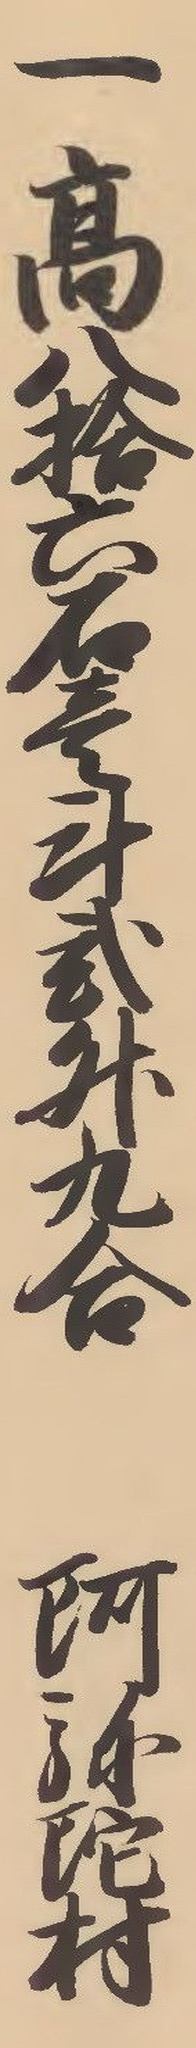一高八拾六石壱斗弐升九合阿弥陀村
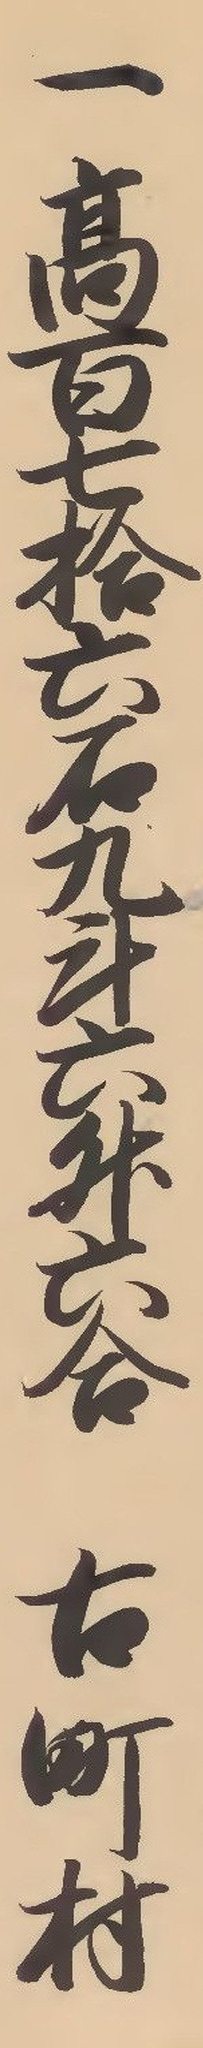一高百七拾六石九斗六升六合古町村
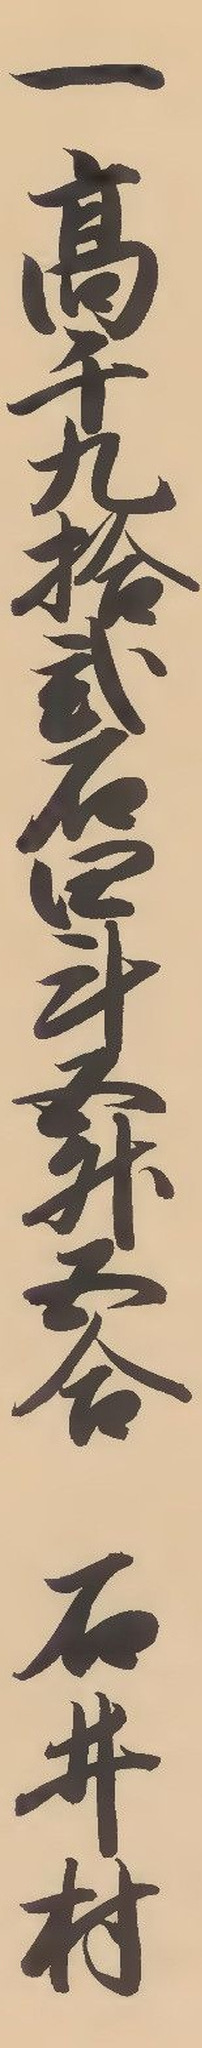一高千九拾弐石四斗五升五合石井村

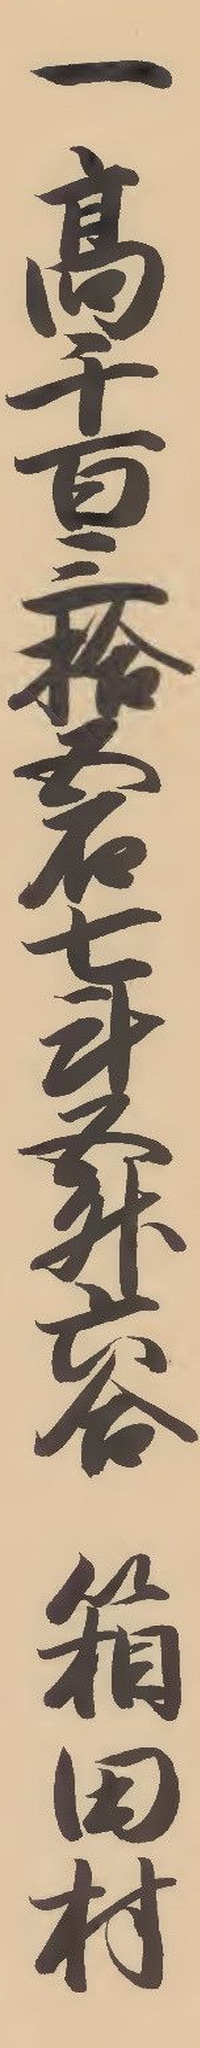一高千百三拾五石七斗五升六合箱田村
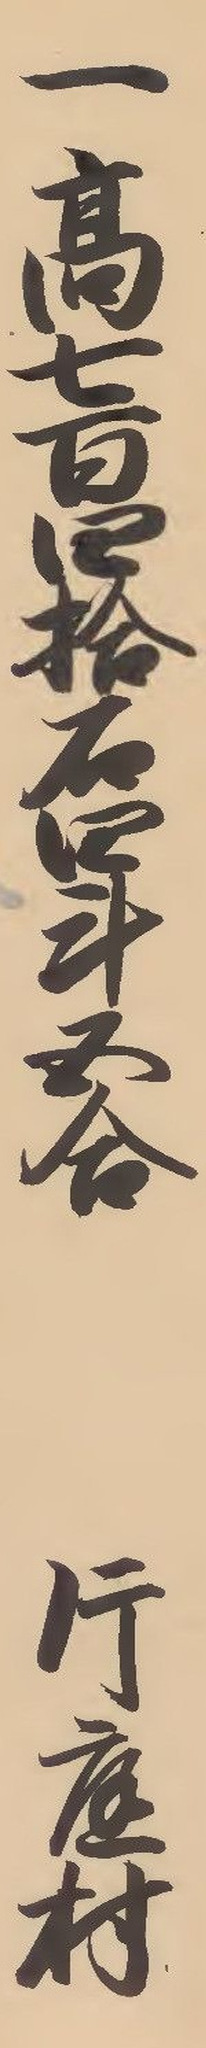一高七百四拾石四斗五合片庭村
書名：常陸国郷帳
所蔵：国立公文書館 National Archives of Japan
